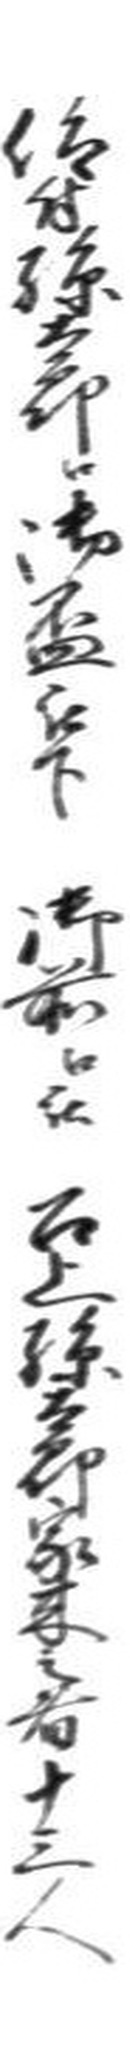仰付孫太郎江御盃被下御前江被召上孫太郎家来之者十三人
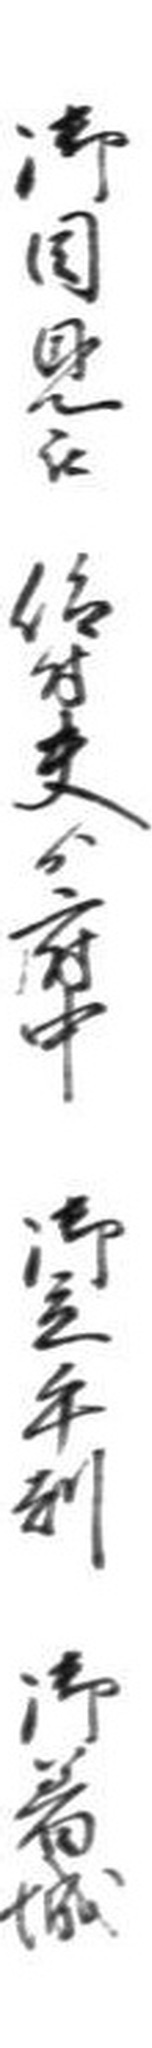御目見被仰付夫ゟ府中御立午刻御着城
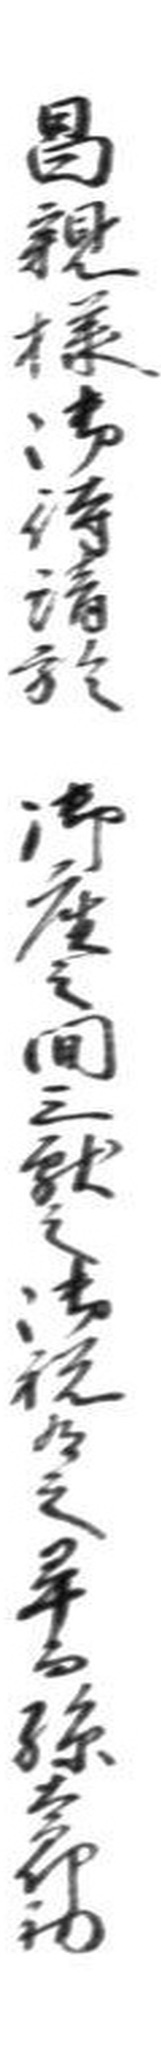昌親様御待請於御座之間三献之御祝有之畢而孫太郎初
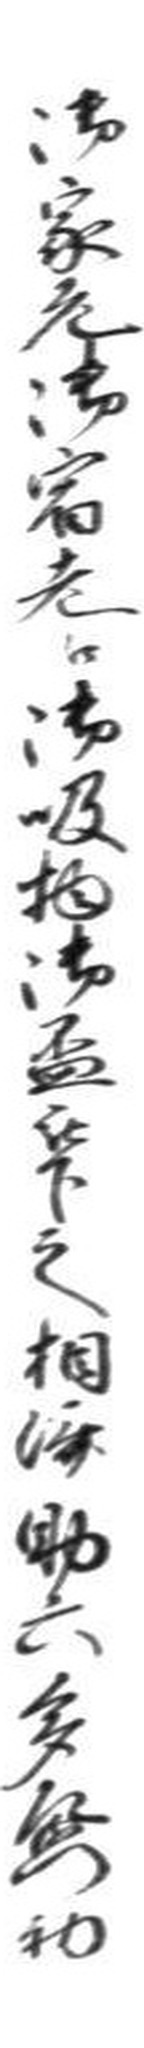御家老御宿老江御吸物御盃被下之相済助六多左衛門初

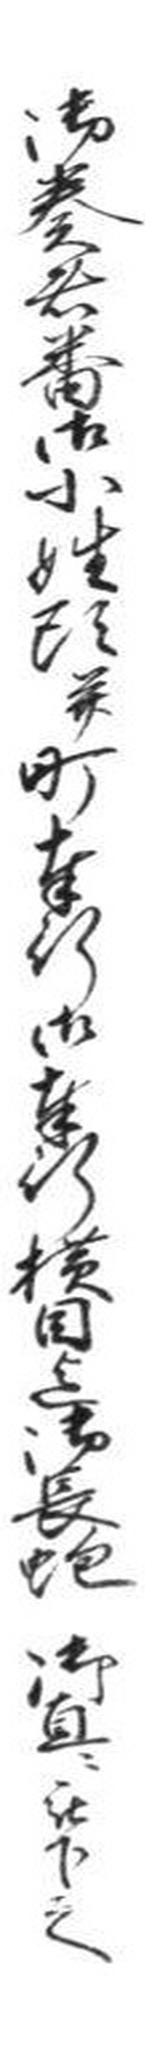御奏者番御小姓頭并町奉行御奉行横目迄御長蚫御直ニ被下之
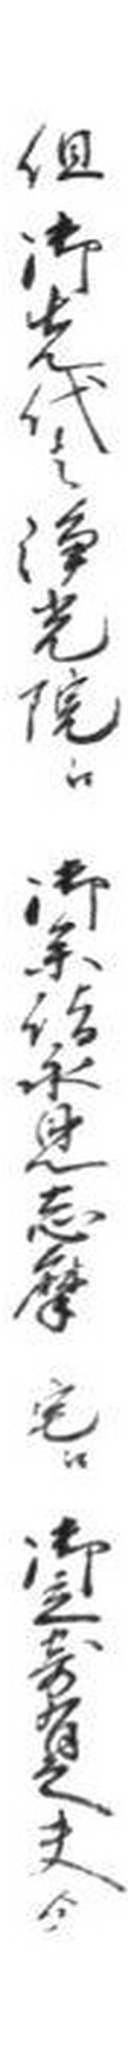但御先代者浄光院江御参詣永見志摩宅江御立寄有之夫ゟ
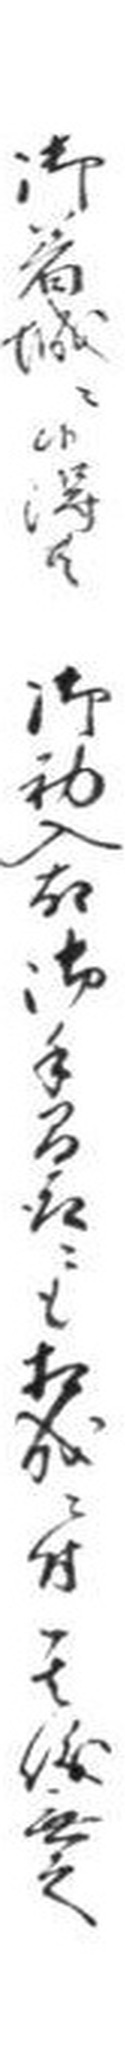御着城ニ候得共御初入故御手間取ニも相成ニ付其儀無之
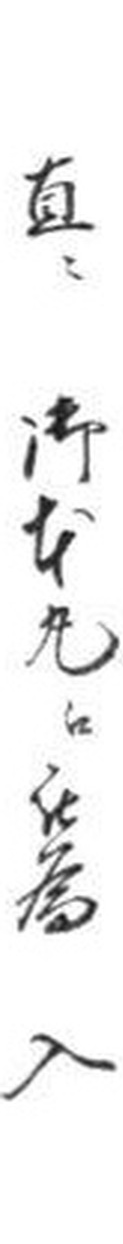直ニ御本丸江被為入
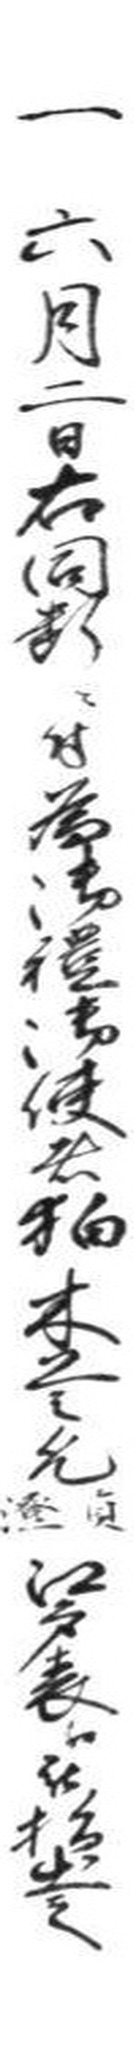一六月二日右同断ニ付為御礼御使者狛木工之允貞澄江戸表江被指出之
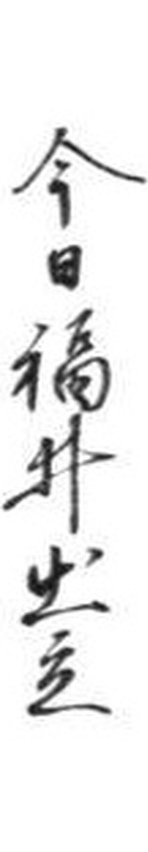今日福井出立
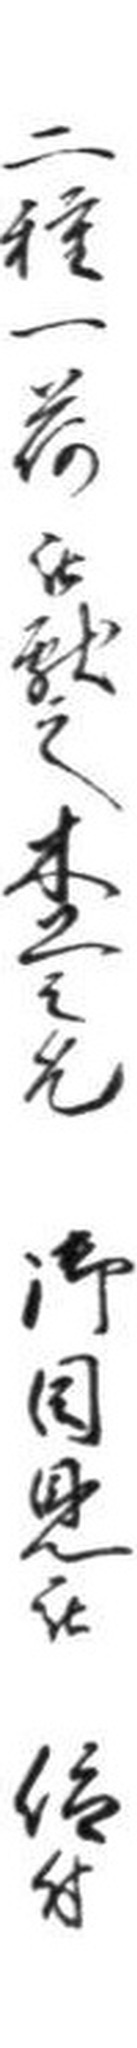ニ種一荷被献之木工之允御目見被仰付
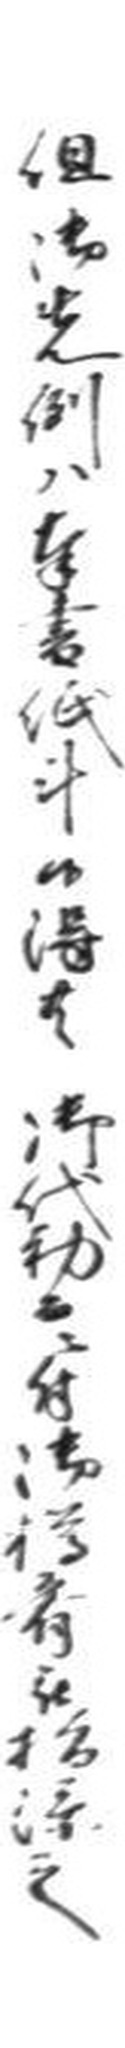但御先例ハ奉書紙計候得共御代初而ニ付御樽肴被指添之
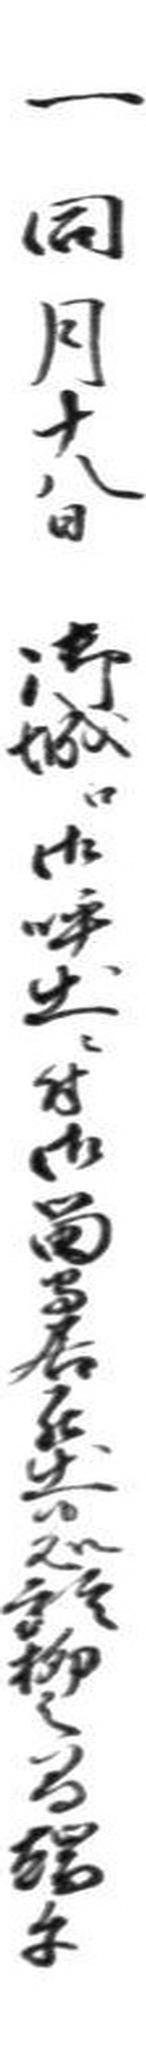一同月十八日御城江御呼出ニ付御留守居罷出候処於柳之間端午
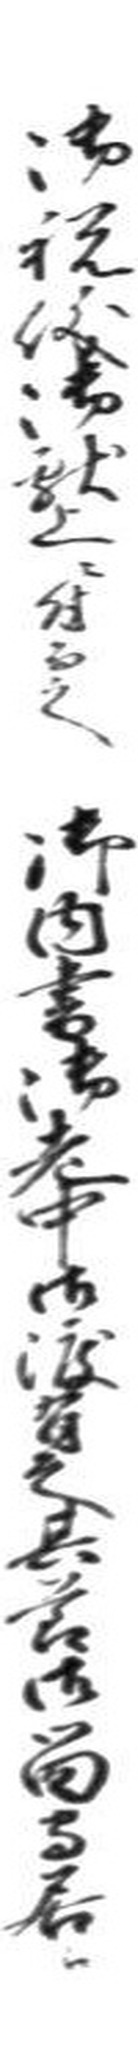御祝儀御献上ニ付而之御内書御老中御渡有之其節御留守居江
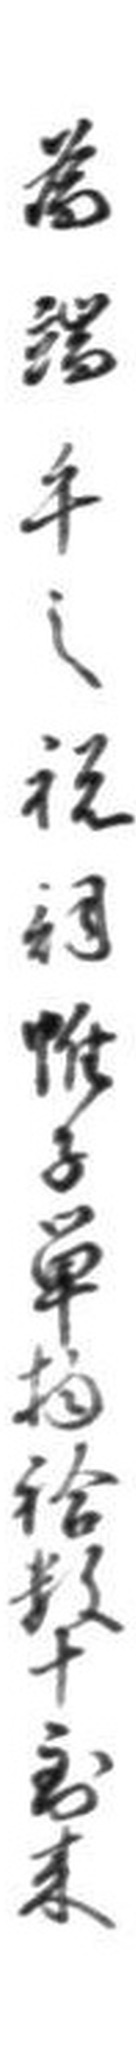為端午之祝詞帷子単物袷数十到来
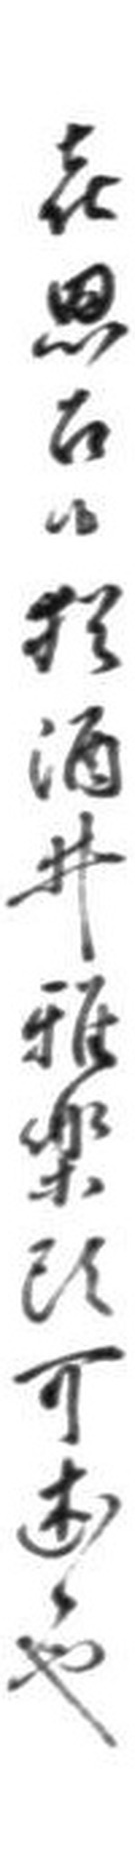喜思召候猶酒井雅楽頭可述候也
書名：家譜 十三 綱昌公 従寛文元年到延宝五年
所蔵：福井県文書館 Fukui Prefectural Archives
